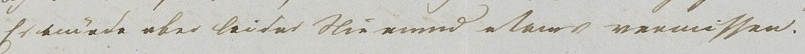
Es würde aber leider Niemand etwas vermissen.
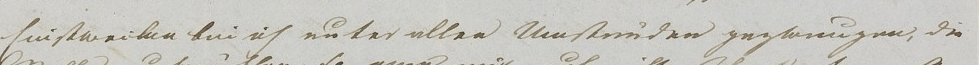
Einstweilen bin ich unter allen Umständen gezwungen, die
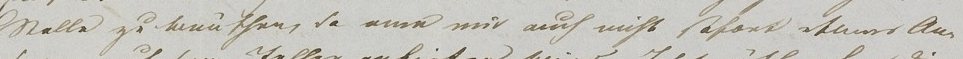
Stelle zu wünschen, da man mir auch nicht sofort etwas An-
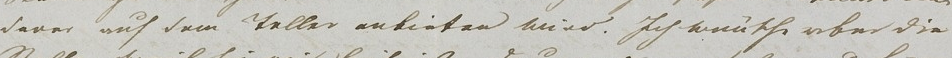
deres auf dem Teller anbieten wird. Ich wünsche aber die
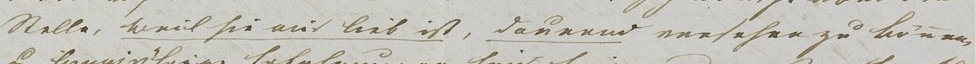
Stelle, weil sie mir lieb ist, dauernd versehen zu können,
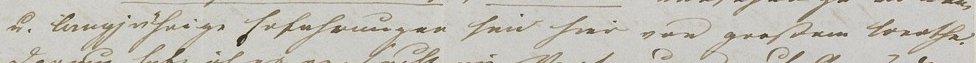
u. langjährige Erfahrungen sind hier von großem Werthe.
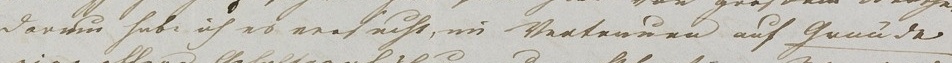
Darum habe ich es versucht, im Vertrauen auf Gründe
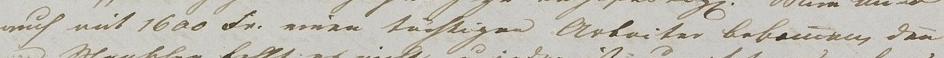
auch mit 1600 Fr. einen tüchtigen Arbeiter bekommen, denn
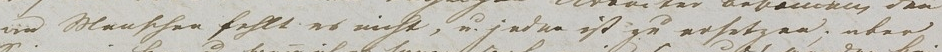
an Menschen fehlt es nicht, u. jeder ist zu ersetzen, aber
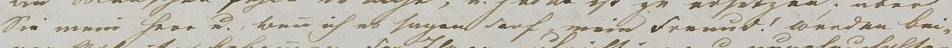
Sie Mein Herr u., wenn ich es sagen darf, mein Freund! werden kei-
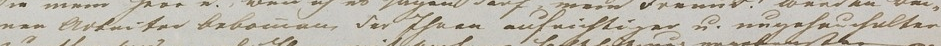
nen Arbeiter bekommen, der Ihnen aufrichtiger u. ungeheuchelter
